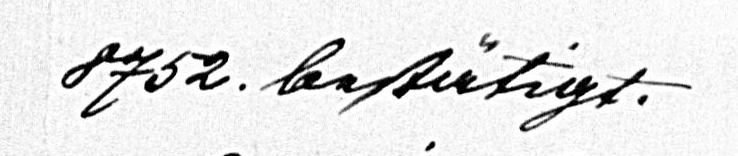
8752. bestätigt.
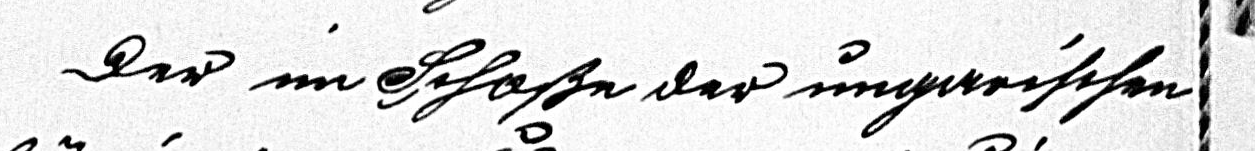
Der im Schoße der ungarischen
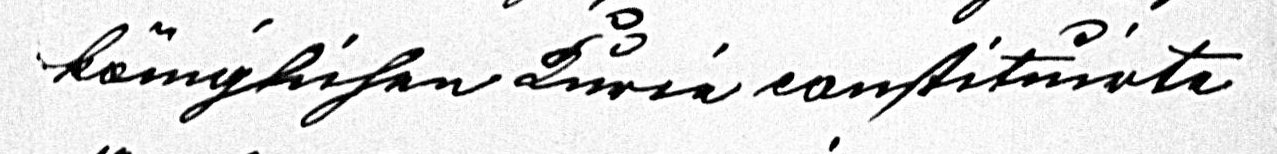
königlichen Kurie constituirte
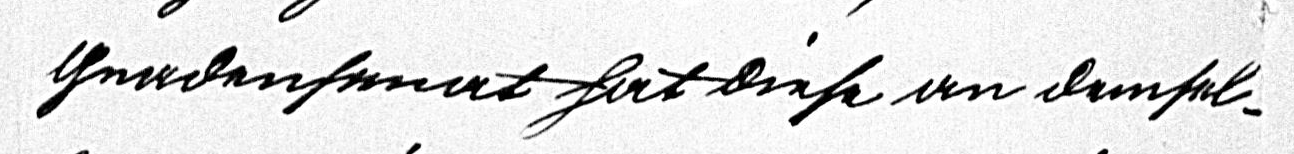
Gnadensenat hat diese an demsel¬
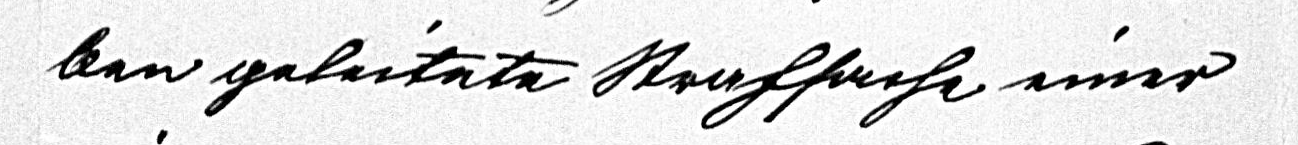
ben geleitete Strafsache einer
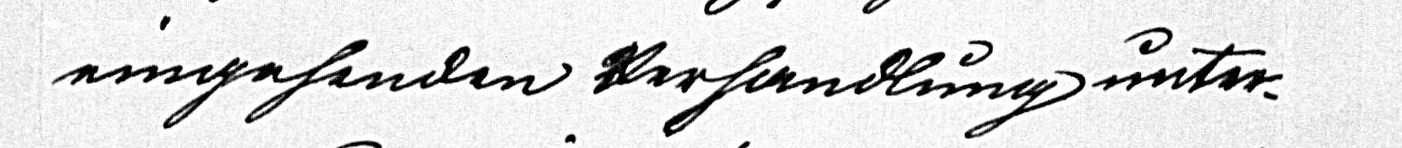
eingehenden Verhandlung unter¬
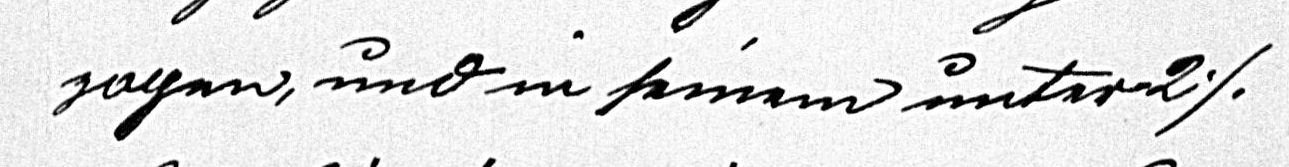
zogen, und in seinem unter 2 ./.
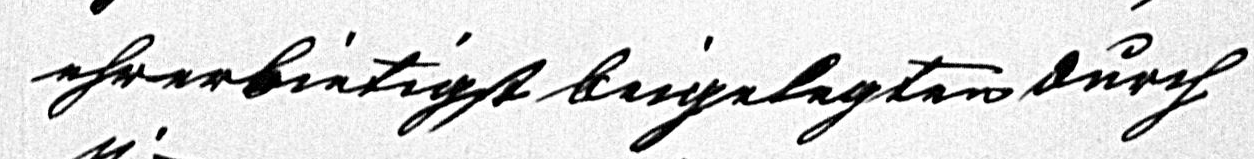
ehrerbietigst beigelegten durch
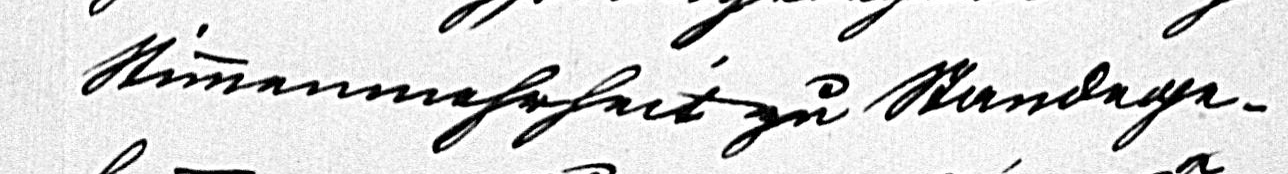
Stimmenmehrheit zu Standege¬
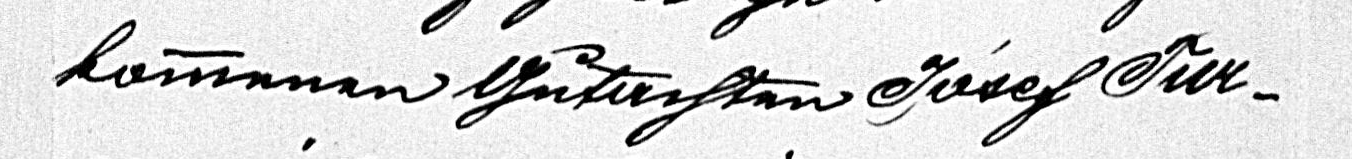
kommenen Gutachten Jósef Tur¬
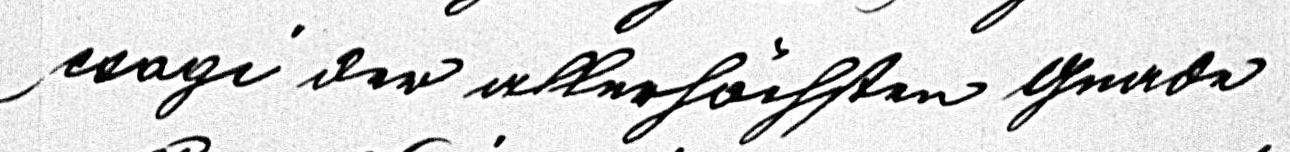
csagi der allerhöchsten Gnade
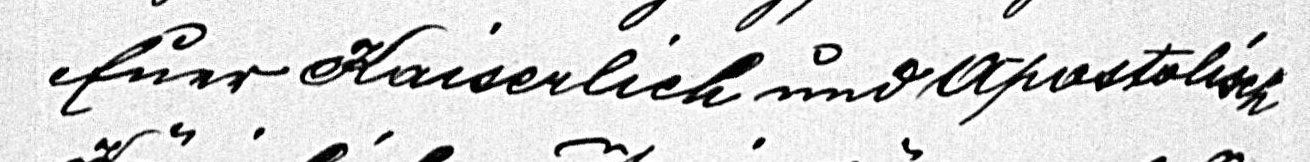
Euer Kaiserlich und Apostolisch
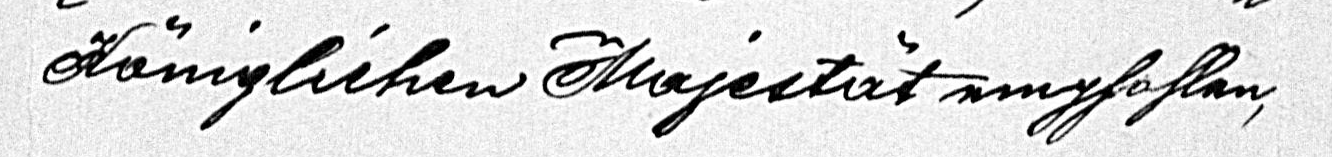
Königlichen Majestät empfohlen
